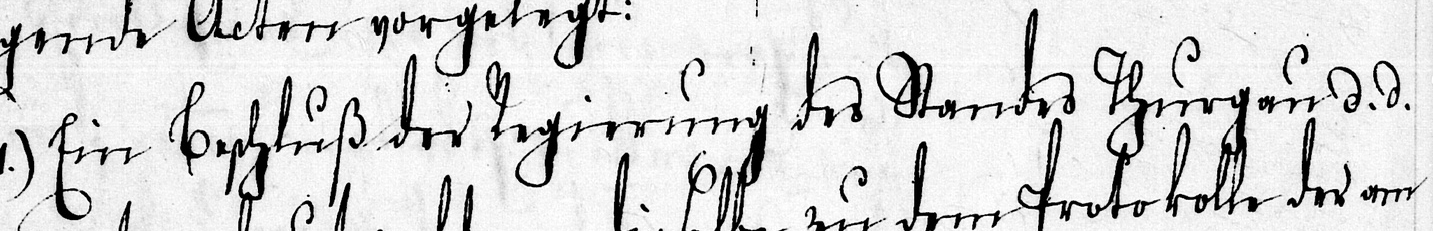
Ein Beschluß der Regierung des Standes Thurgau d. d.
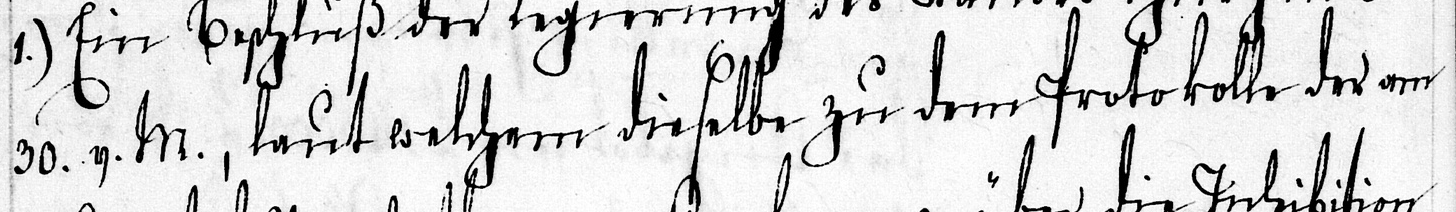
v. M., laut welchem dieselbe zu dem Protokolle der am
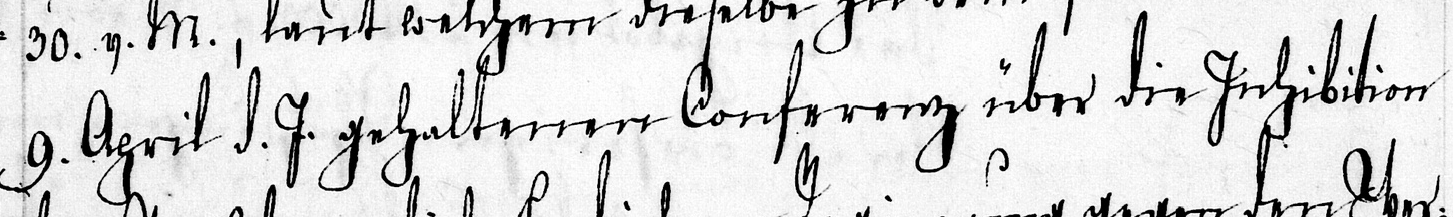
9. April d. J. gehaltenen Conferenz über die Inhibition
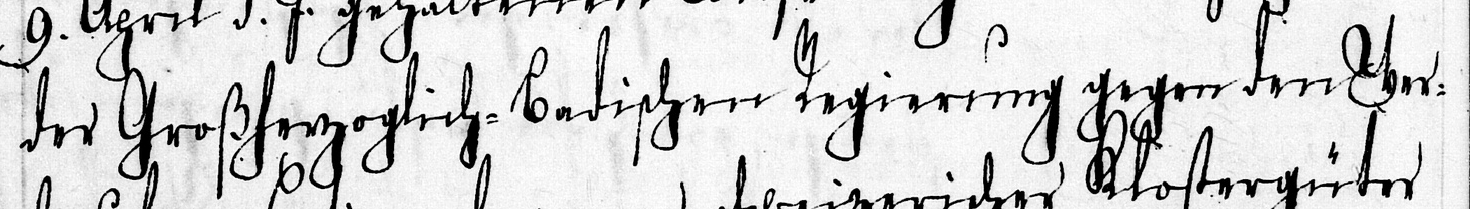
der Großherzoglich-Badischen Regierung gegen den Ver¬
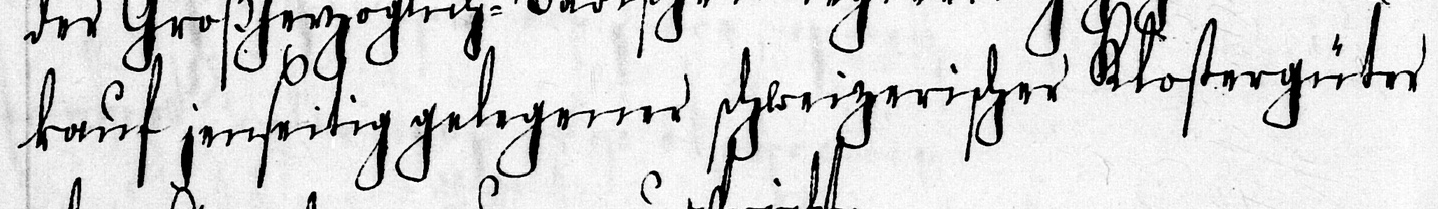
kauf jenseitig gelegener schweizerischer Klostergüter
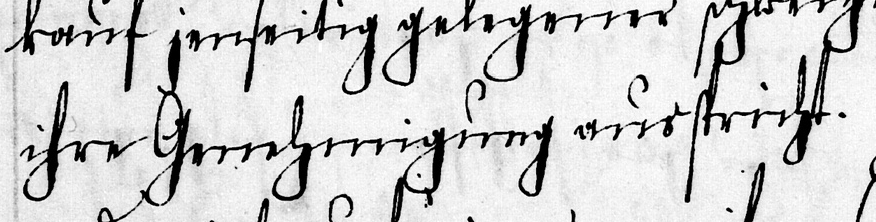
ihre Genehmigung ausspricht.
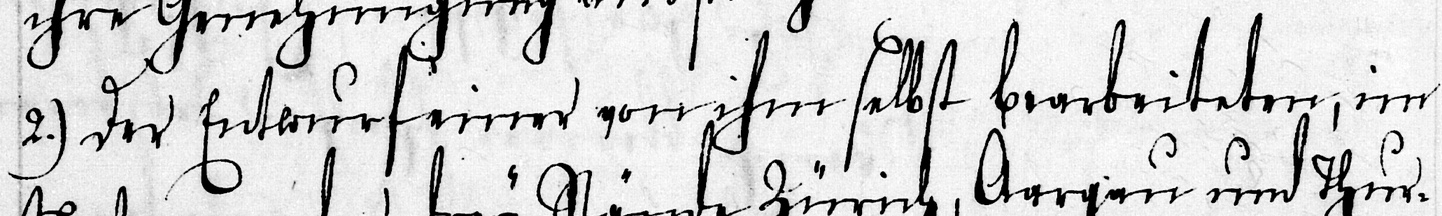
2.) Der Entwurf einer von ihm selbst bearbeiteten, im
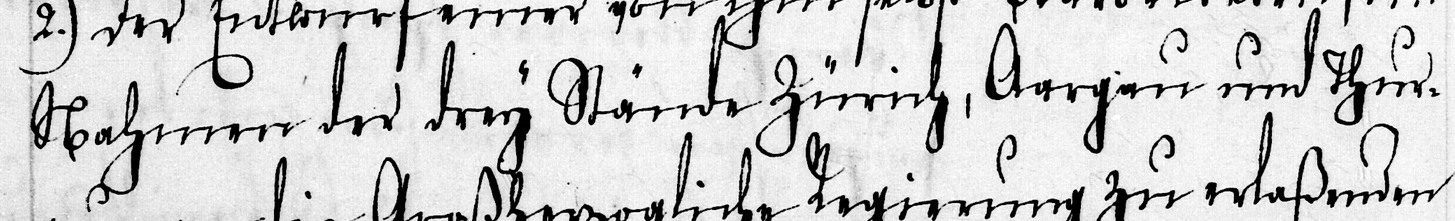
Nahmen der drey Stände Zürich, Aargau und Thur¬
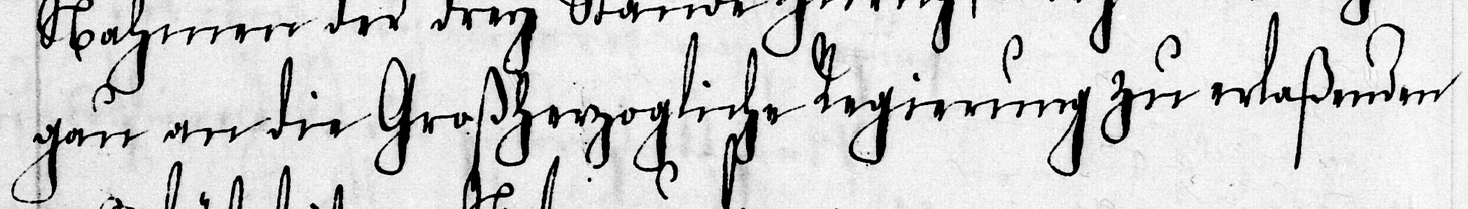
gau an die Großherzogliche Regierung zu erlaßenden
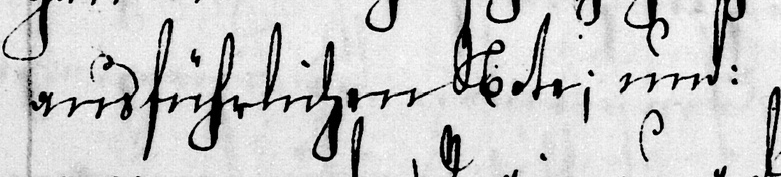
ausführlichen Note; und:
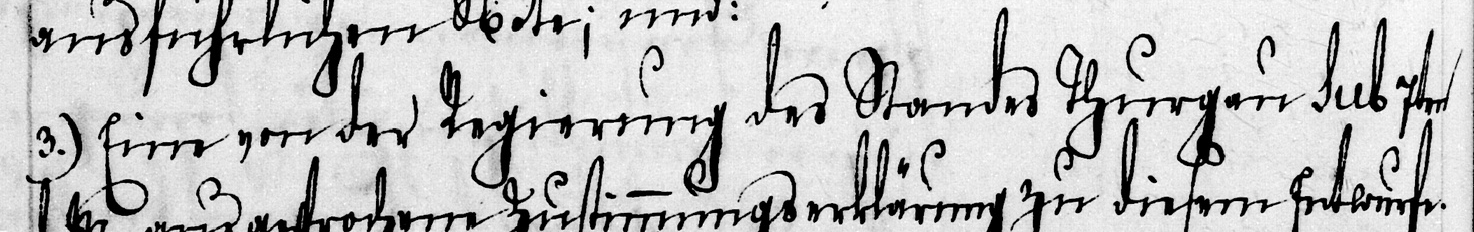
3.) Eine von der Regierung des Standes Thurgau sub 7ten
